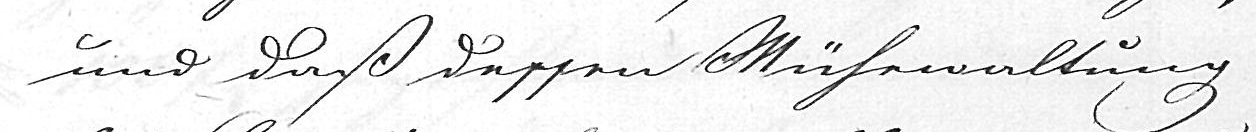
und daß dessen Mühewaltung
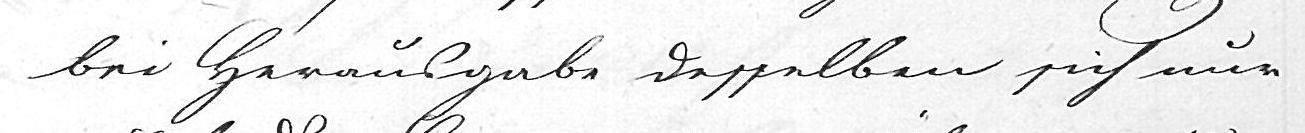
bei Herausgabe desselben sich nur
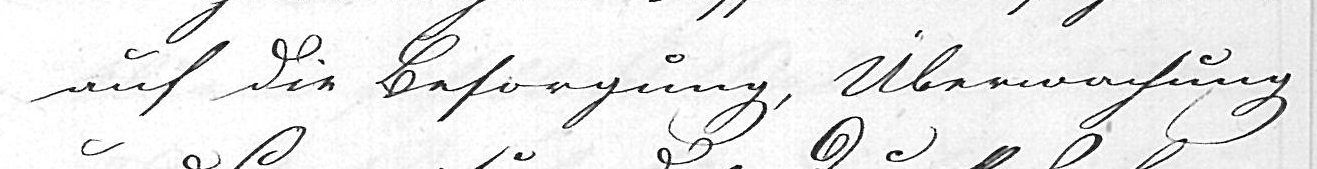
auf die Besorgung, Überwachung
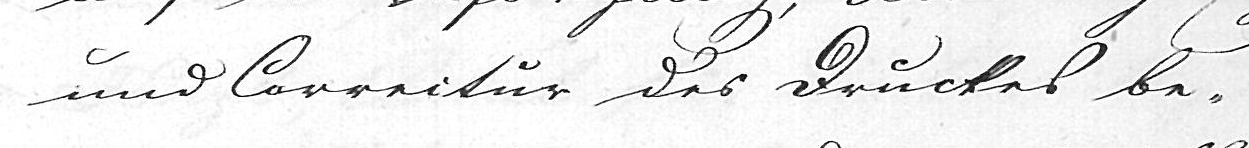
und Correctur der Druckes be-
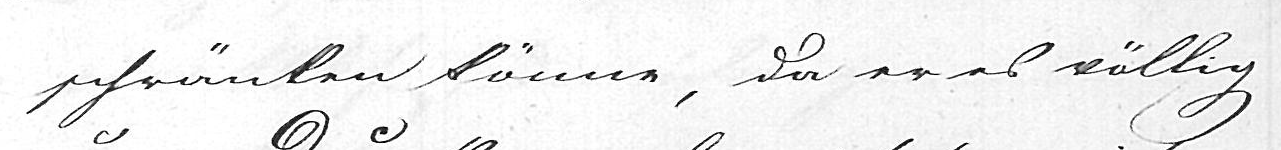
schränken könne, da er es völlig
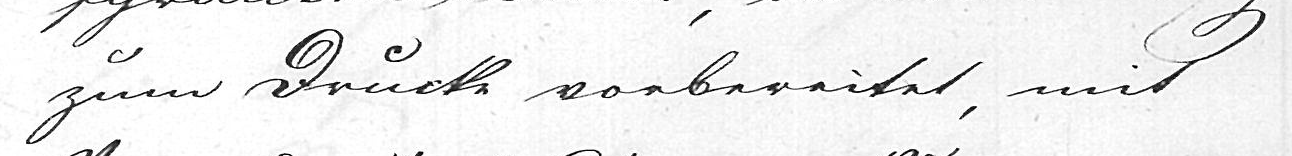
zum Druck vorbereitet, mit
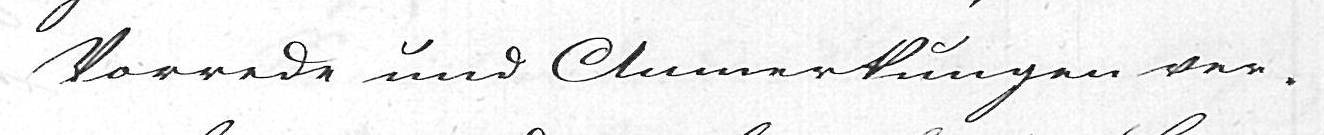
Vorrede und Anmerkungen ver-
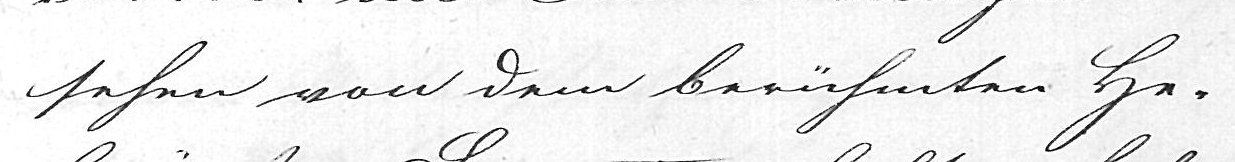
sehen von dem berühmten He-
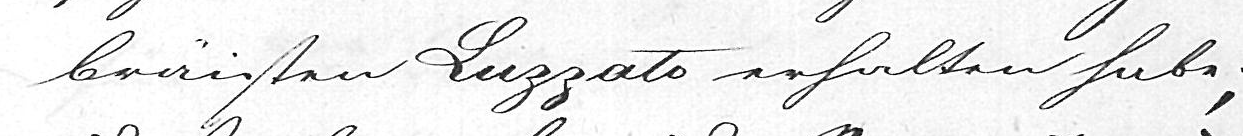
bräisten Luzzato erhalten habe;
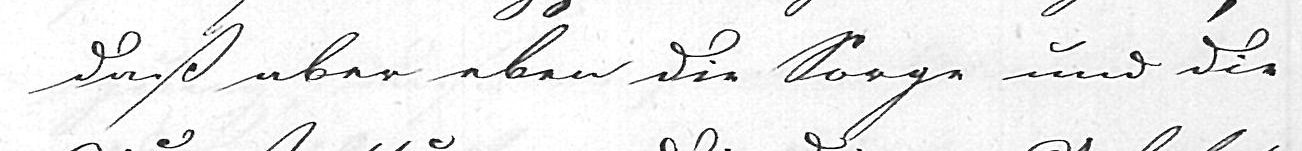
daß aber eben die Sorge und die
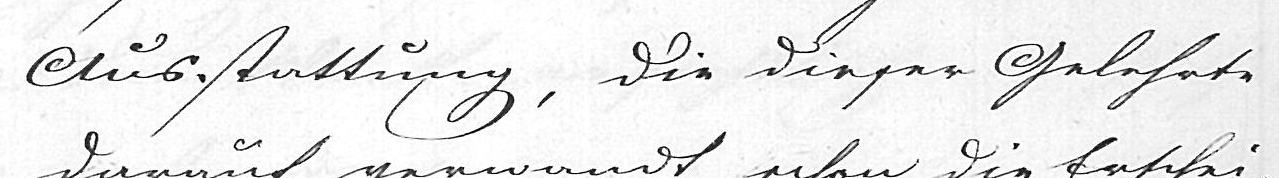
Ausstattung, die dieser Gelehrte
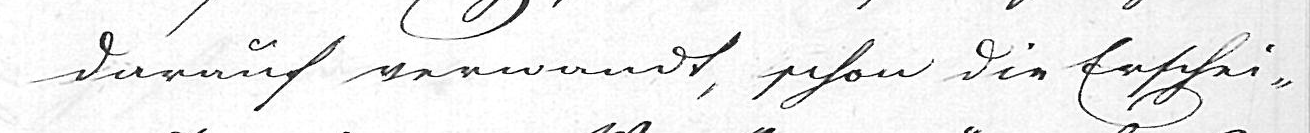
darauf verwandt, schon die Erschei-
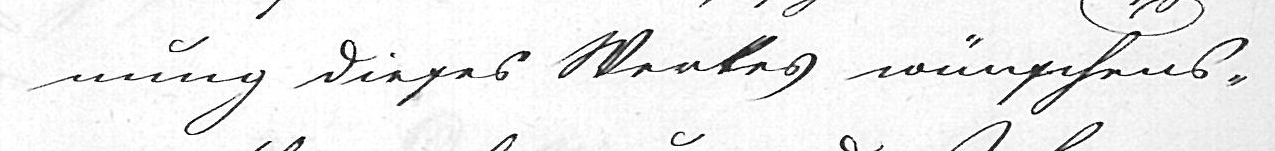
nung dieses Werkes wünschens-
